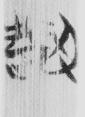{刱田}
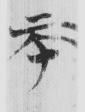帀
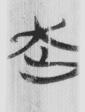走
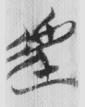𫊟
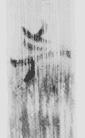先
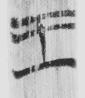王
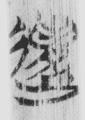{辶𦥔豕}
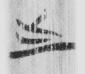之
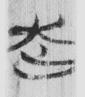走
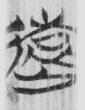遠
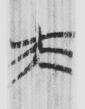夫
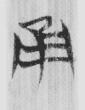甬
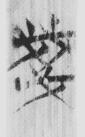{戔戈}
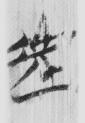𫊟
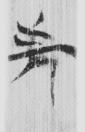先
